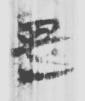是
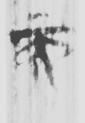而
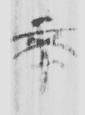不
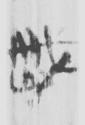慼
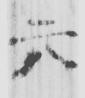亓
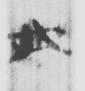四
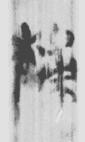{木甫}
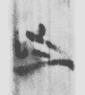之
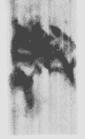與
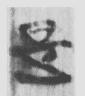是
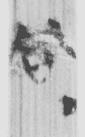同
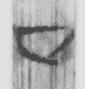四
